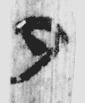夕
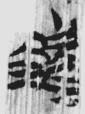灋（廢）
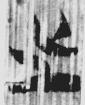之
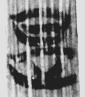是
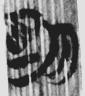則
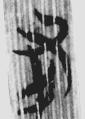○（盡）
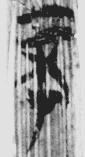不
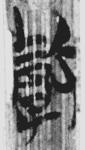○（穀）
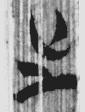之
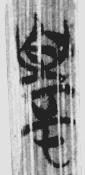辠（罪）
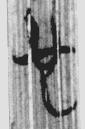也
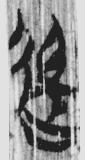○（後）
